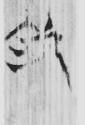及
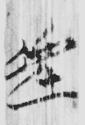𫊟
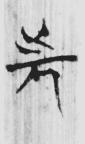先
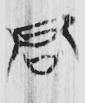君
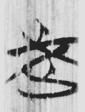武
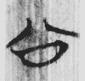公
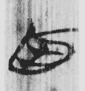西
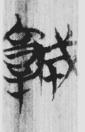{享成}
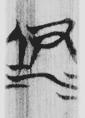洢
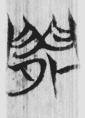{門外}
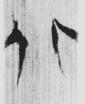北
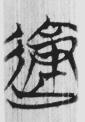{辶𫢁}
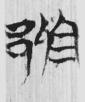{於阝}
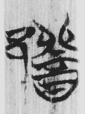{邑卯酉}
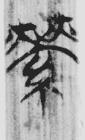縈
